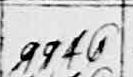9946
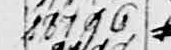13796
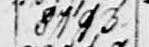8793
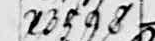23598
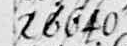26640
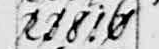23816
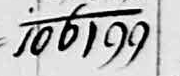106199
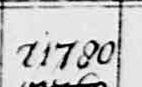21780
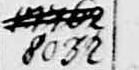8032
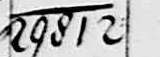29812
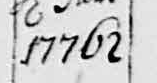17762
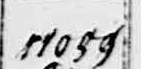11059
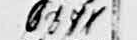6351
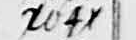2041
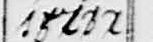15232
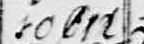10612
